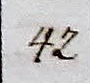42
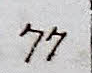77
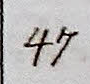47
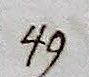49
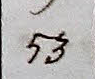53
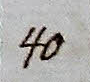40
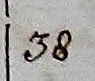38
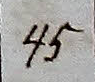45
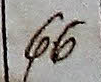66
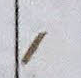1
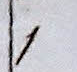1
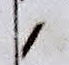1
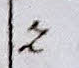2
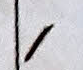1
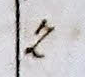2
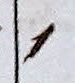1
